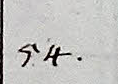54.
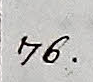76
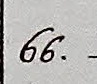66.
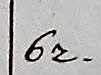62
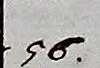56.
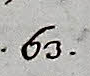63
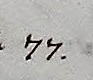77.
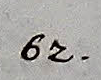62
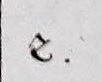2.
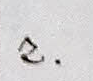2.
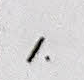1.
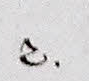2.
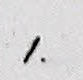1.
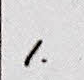1.
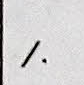1.
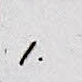1.
